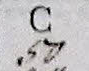50
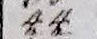44
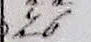26
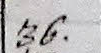36.
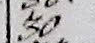30
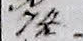74
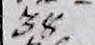38
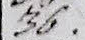36
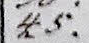45
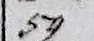59
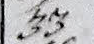33
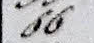66
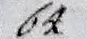64
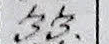33.
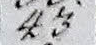43
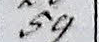59
